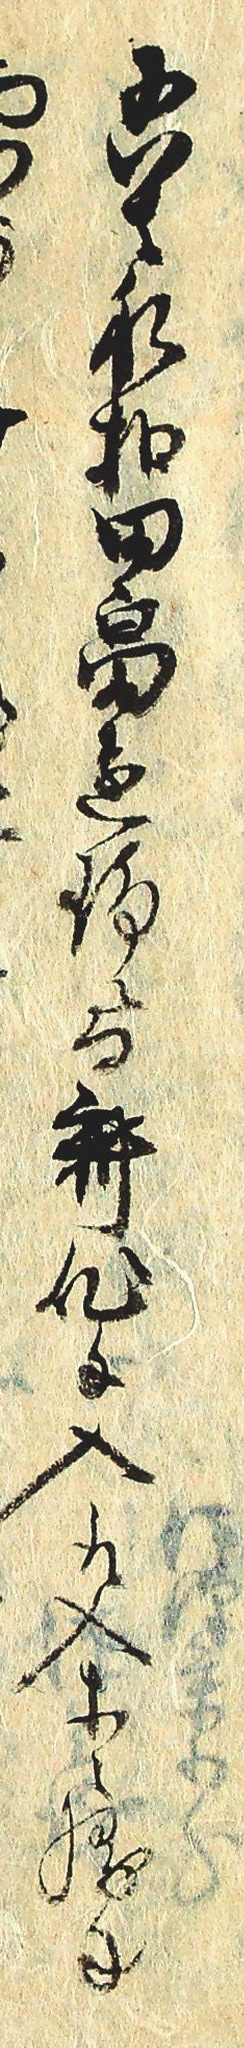右は私扣田畠遠野にて耕作手入取入等に勝手
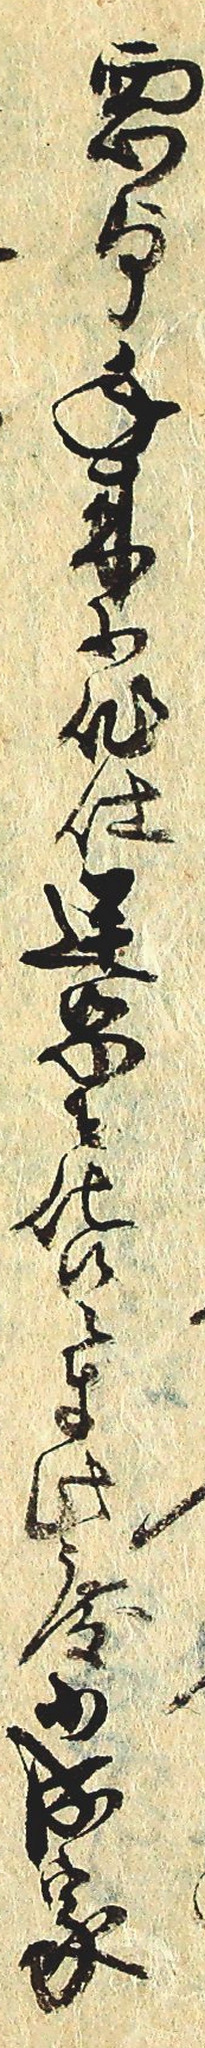悪布年来不作仕迷惑奉仕候に付此度小成家
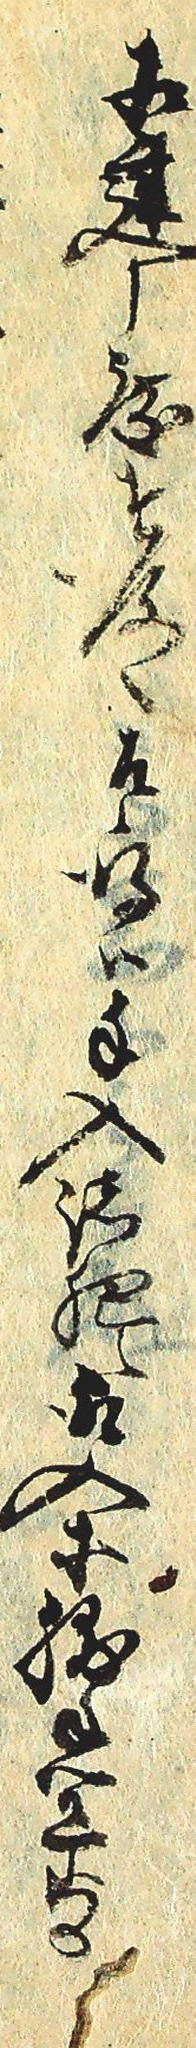相建申度奉存候左候得は手入諸肥に取入等勝手宜布
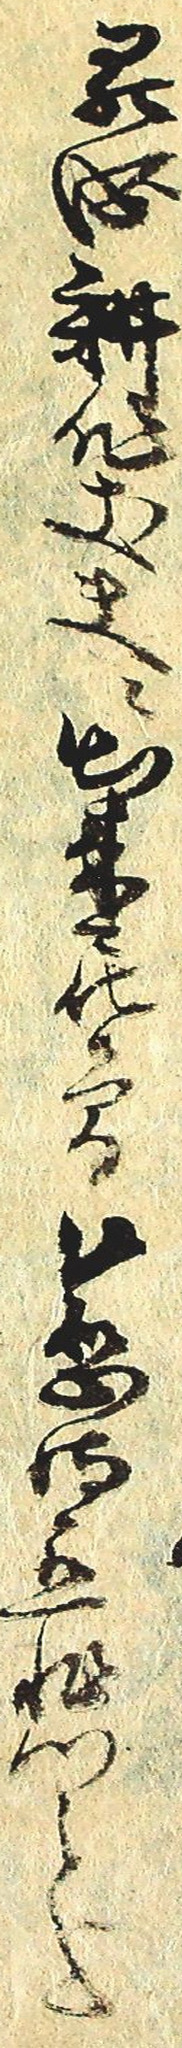罷成耕作丈夫に出来可仕候間乍恐御慈悲之上
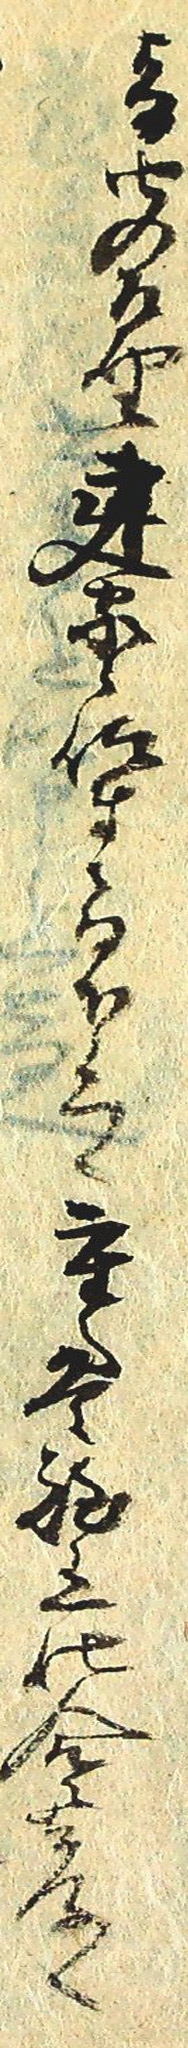被為聞召届建家被仰付被下候はゝ重畳難有仕合に奉存候
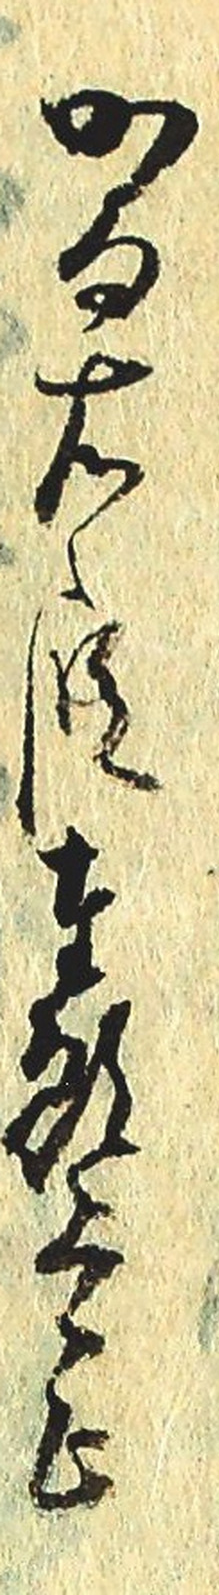仍て右之段奉願上候以上
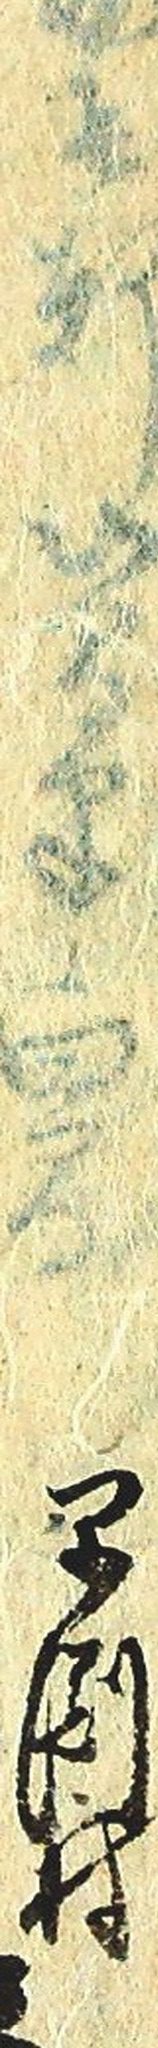早淵村
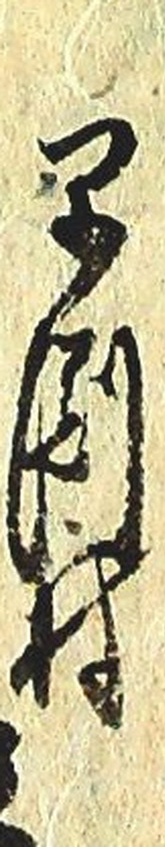早淵村
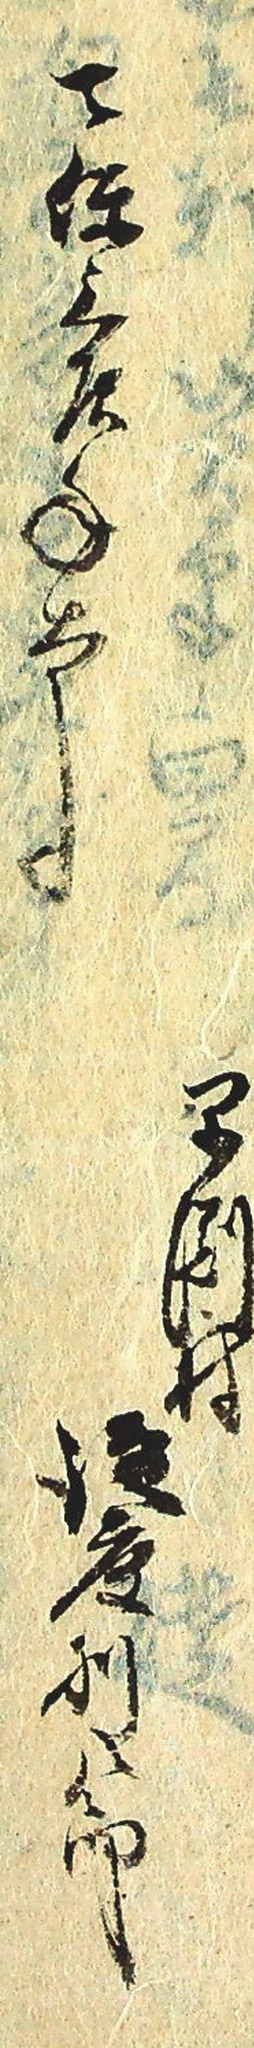天保三辰年十一月後藤利八郎
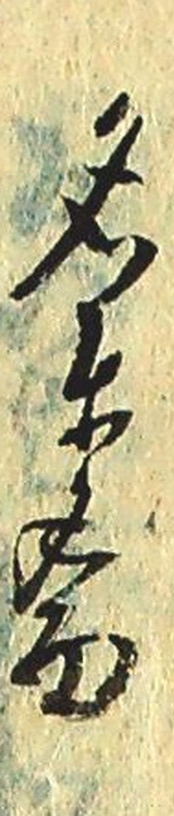名東名西
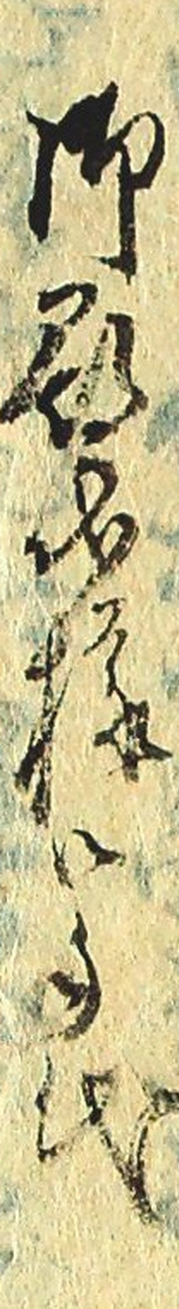御郡代様御手代
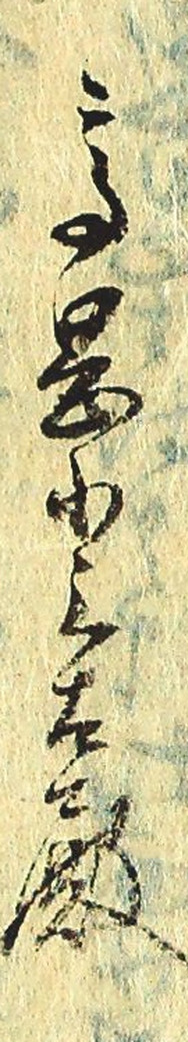高岡小三太殿
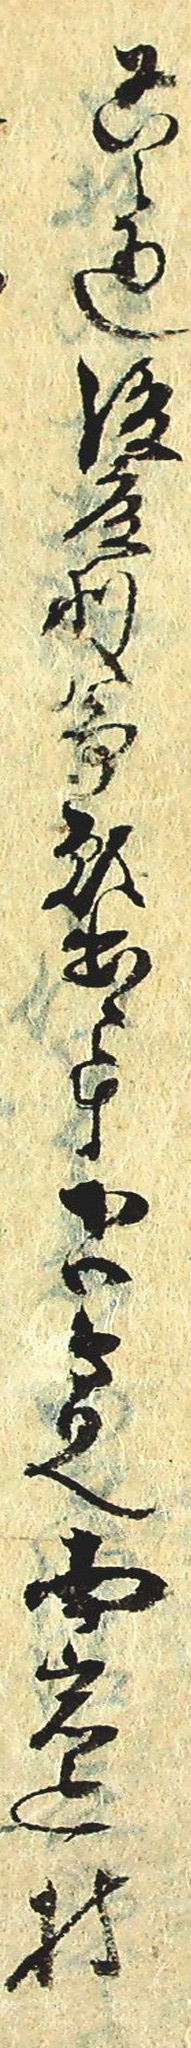右之通後藤利八郎願出候に付下御鳥見南岩延村
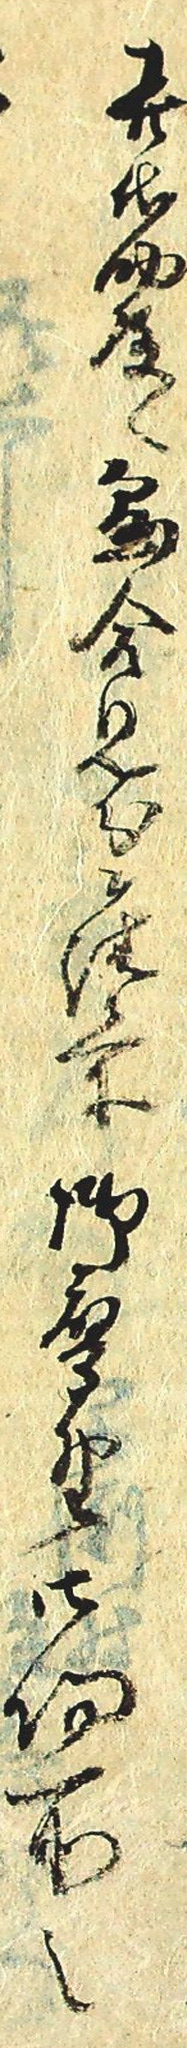喜代助殿へ懸合見分を請候所御鷹野御場所之
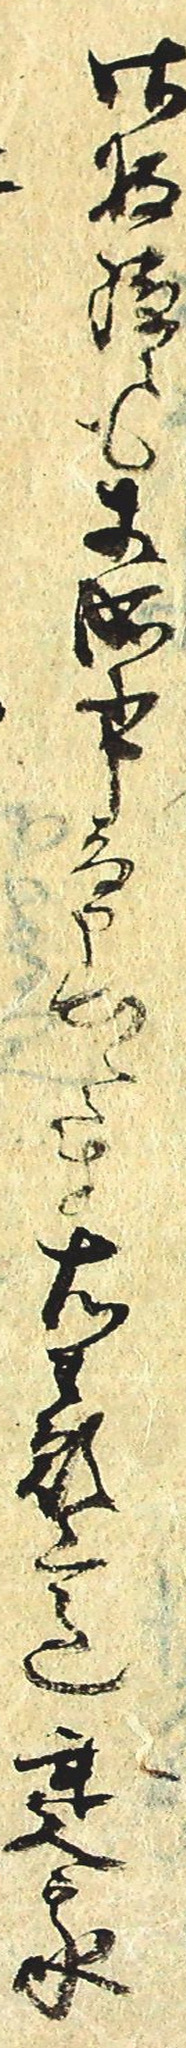御指障にも相成不申旨申出候に付右奉願上通建家
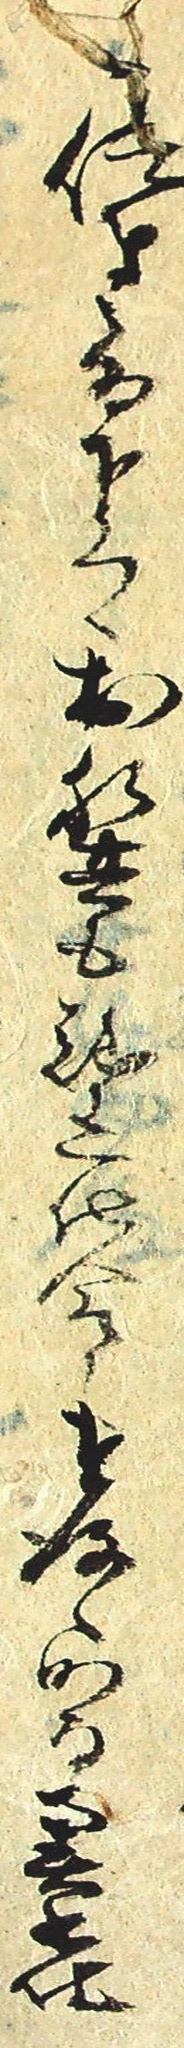被仰付被為下候はゝ於私共も難有仕合に奉存候仍て奥書仕
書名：諸御願書控(弐番）
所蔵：鳴門教育大学 Naruto University of Education
